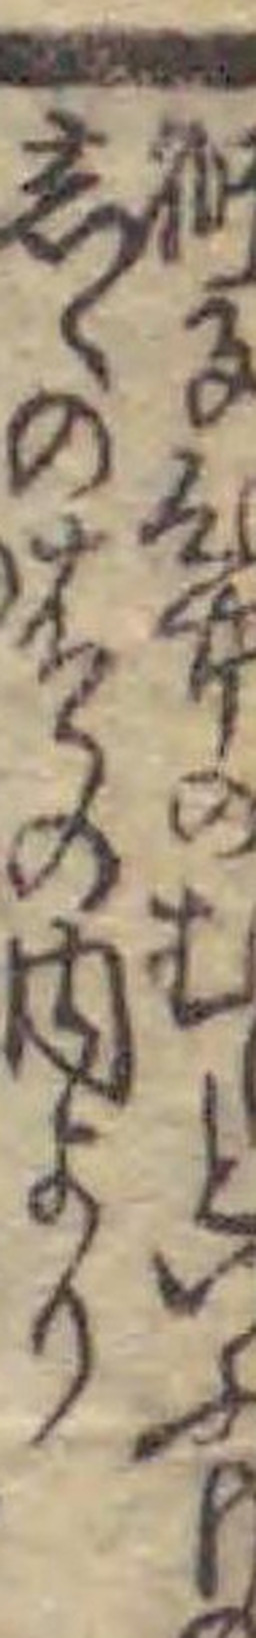しゝのはらの内より
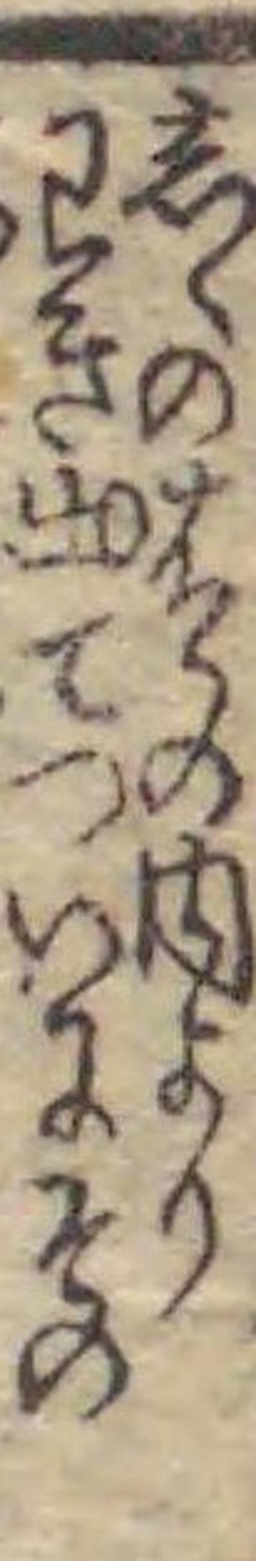わき出てついにその
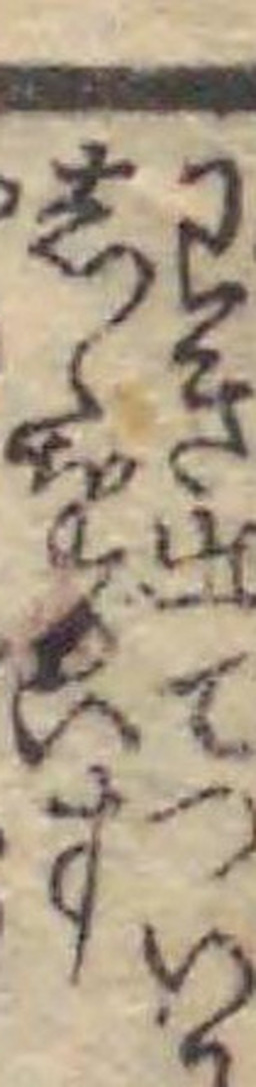しゝをがいす
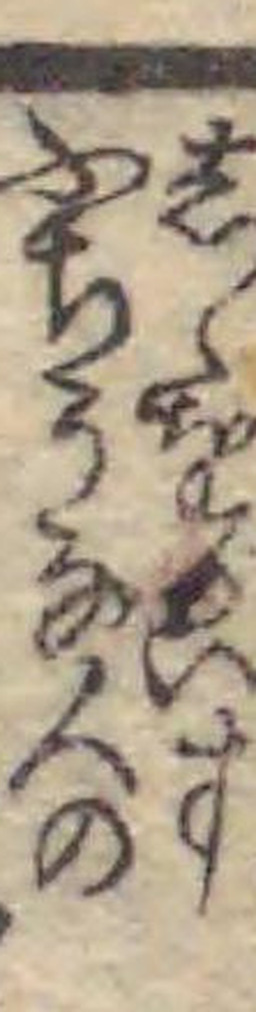ふちうな人の
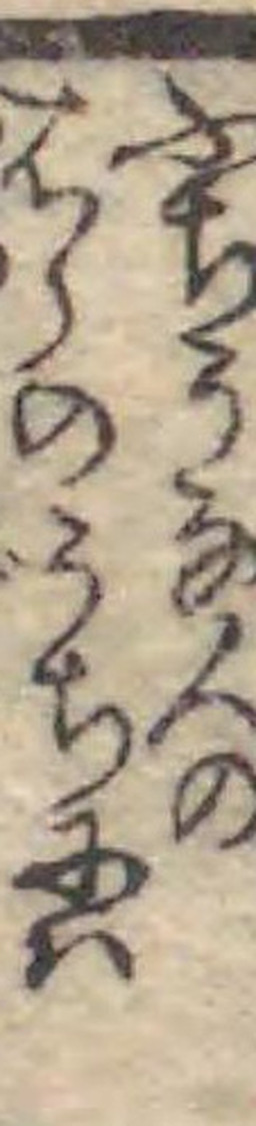はらのうちには
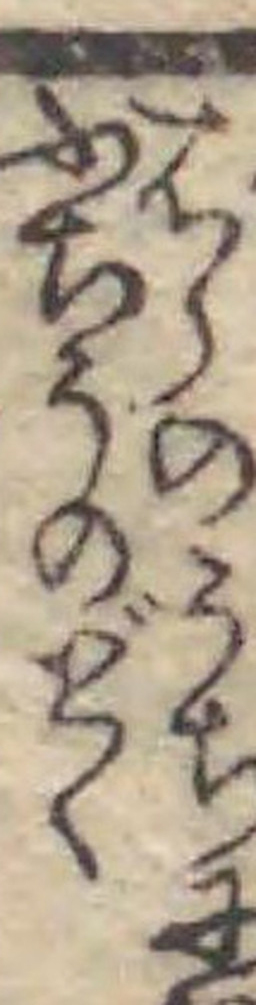ふちうのどく
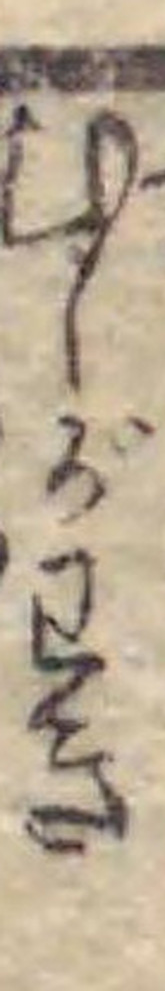むしがわき
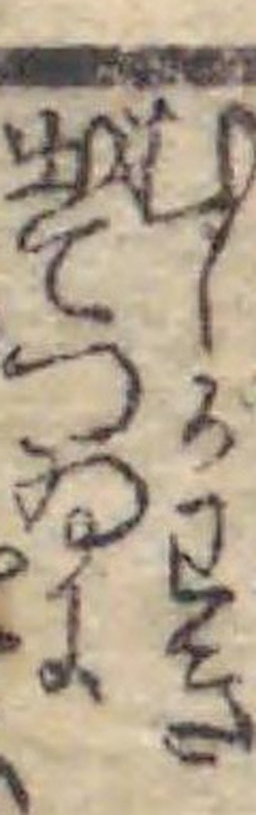出てつゐに
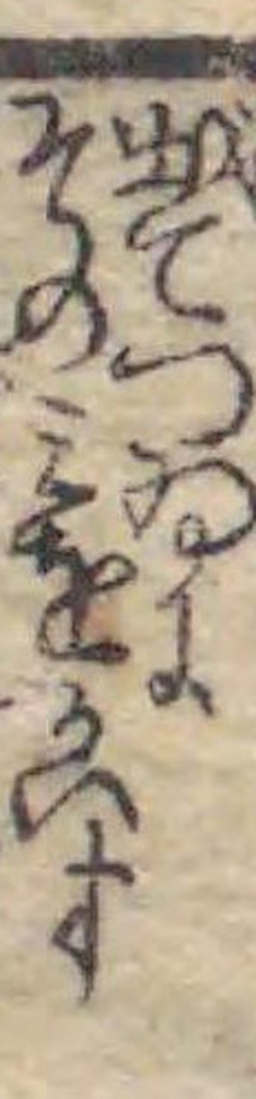そのみをかいす
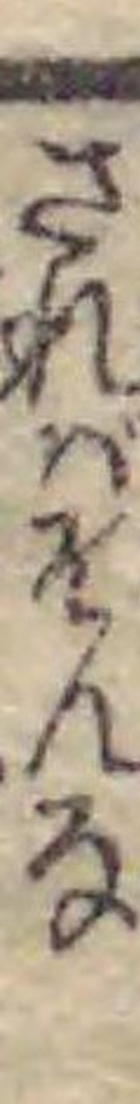さればそんな
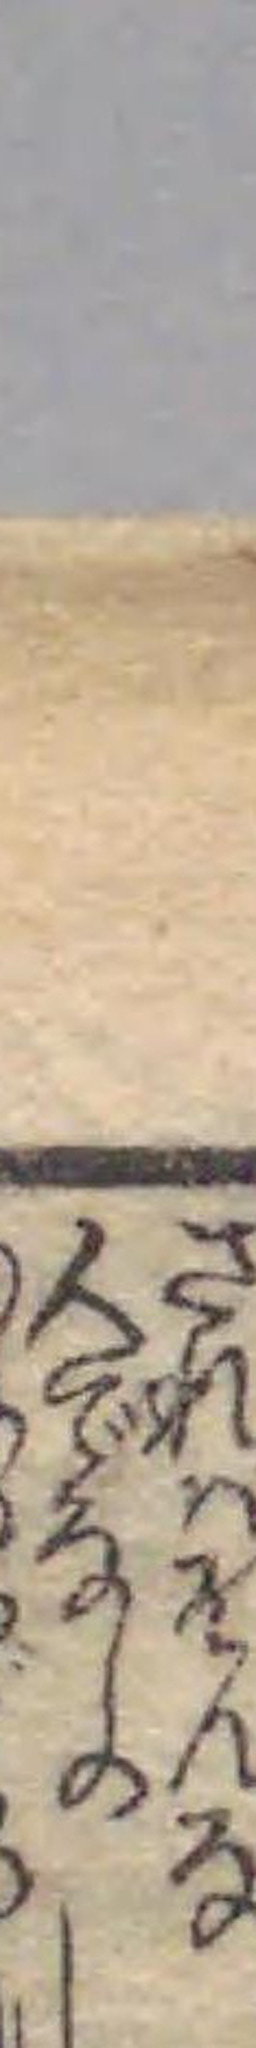人でなしの
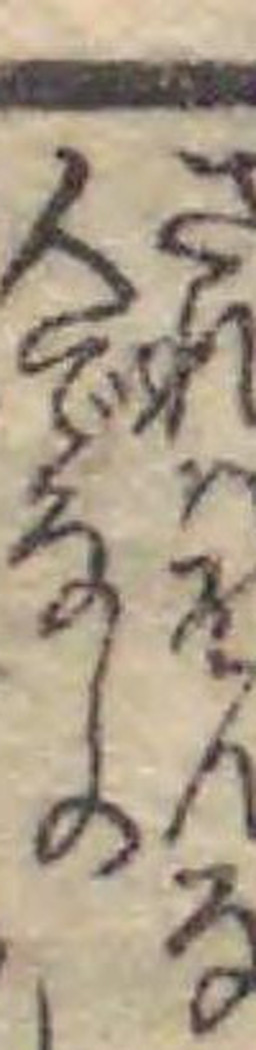人でなしの
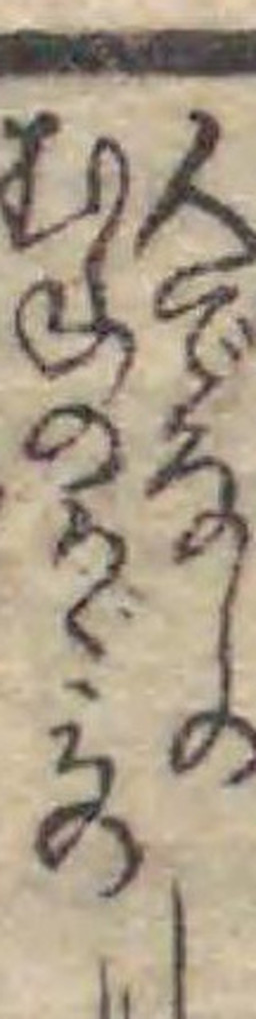むねのかゞみの
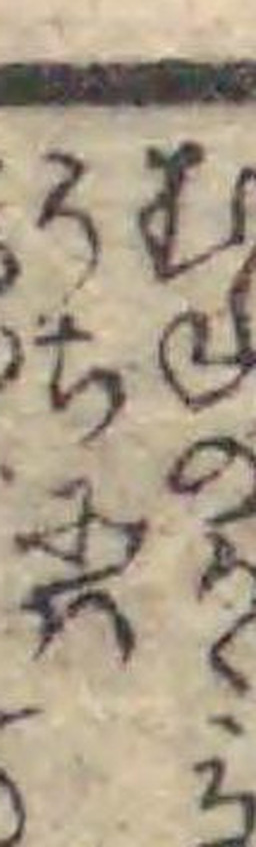うちには
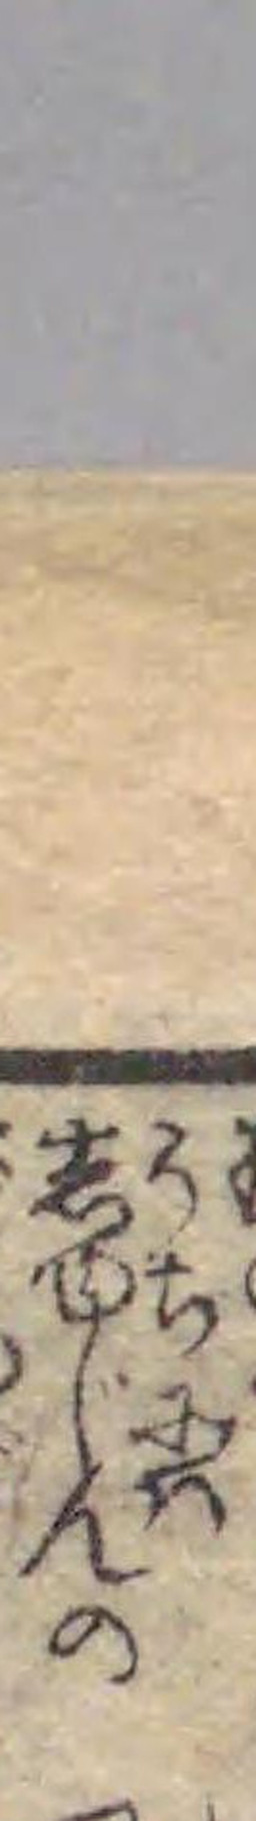しゆじんの
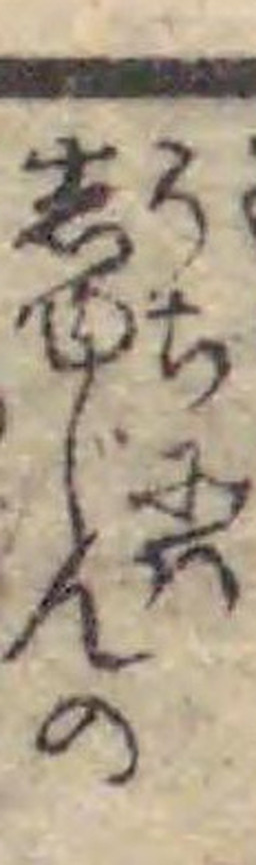しゆじんの
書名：人心鏡写絵 : 3巻
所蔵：国立国会図書館 National Diet Library, JAPAN
